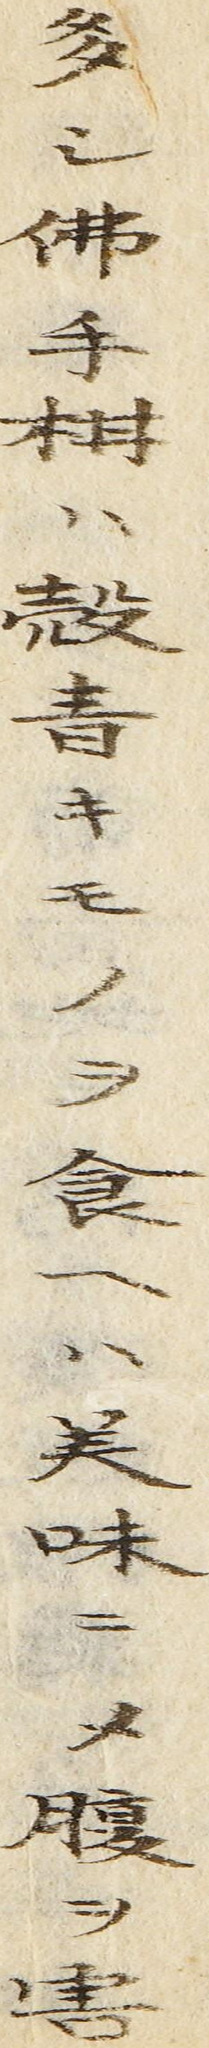多シ仏手柑ハ殻青キモノヲ食ヘハ美味ニシテ腹ヲ害
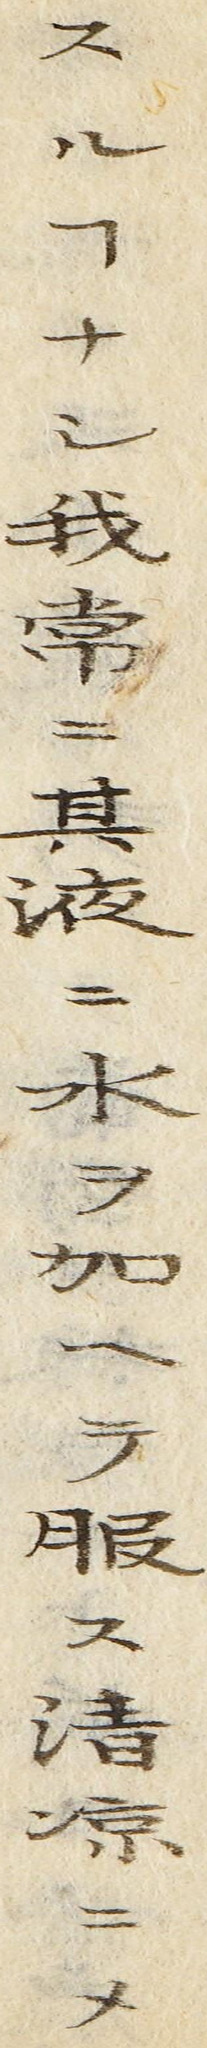スルコトナシ我常ニ其液ニ水ヲ加ヘテ服ス清涼ニシテ
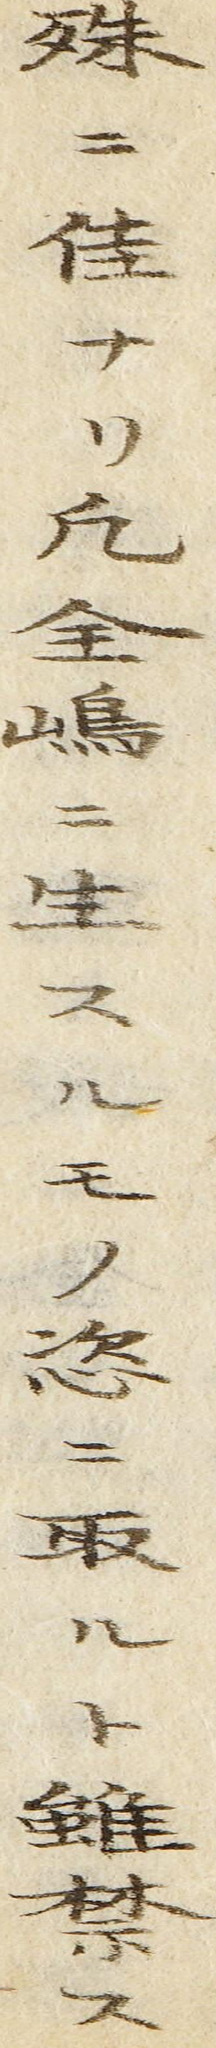殊ニ佳ナリ凡全島ニ生スルモノ恣ニ取ルト雖禁ス
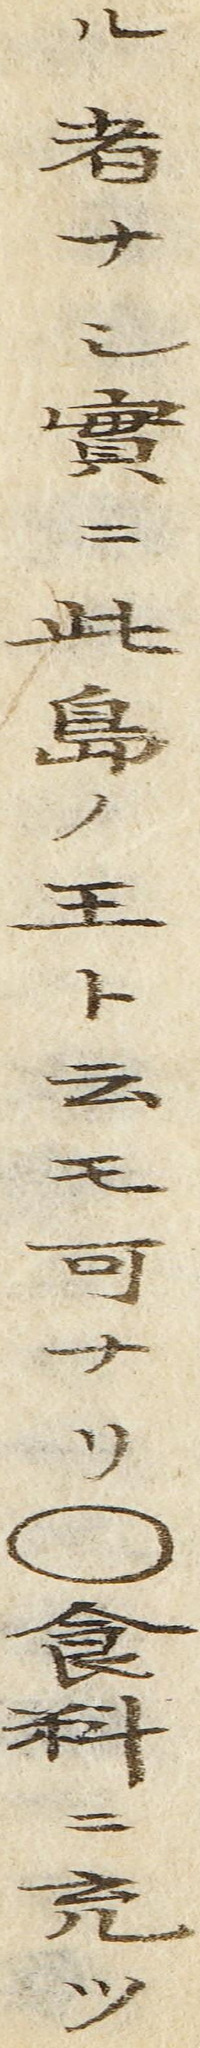ル者ナシ実ニ此島ノ王ト云モ可ナリ◯食料ニ充ツ
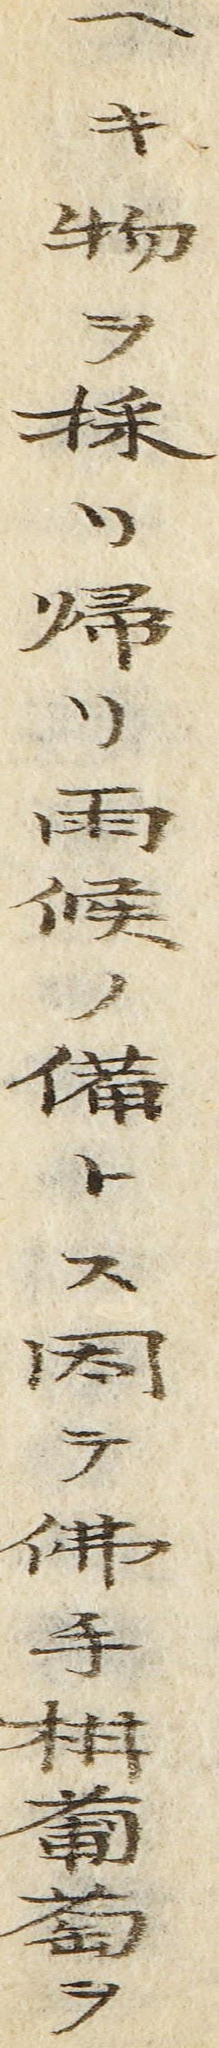ヘキ物ヲ採リ帰リ雨候ノ備トス因テ仏手柑葡萄ヲ

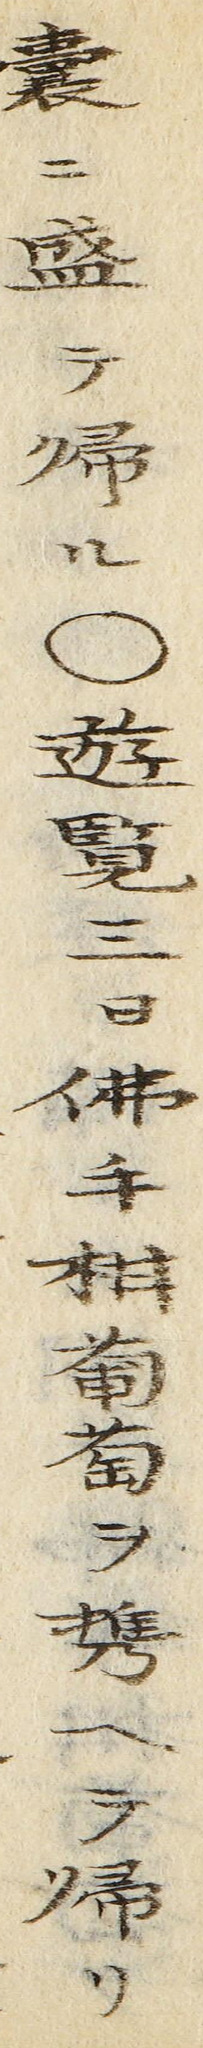嚢ニ盛テ帰ル◯遊覧三日仏手柑葡萄ヲ携ヘテ帰リ
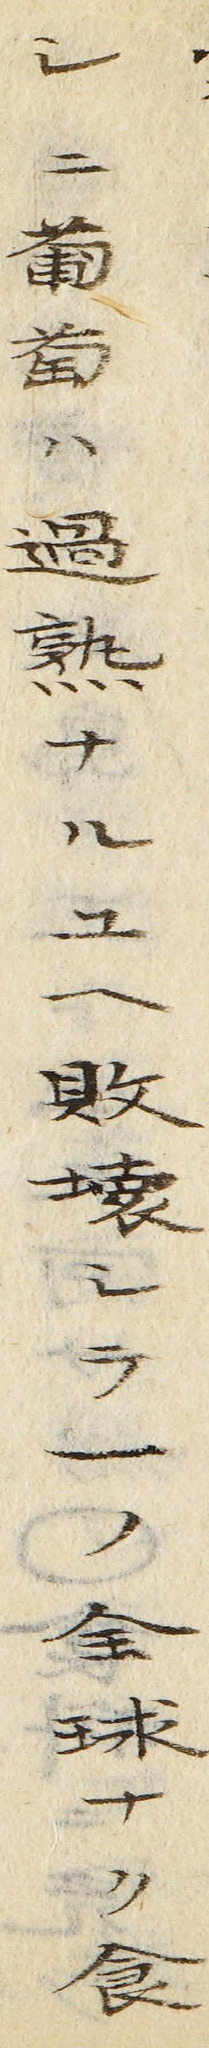シニ葡萄ハ過熟ナルユヘ敗壊シテ一ノ全球ナリ食
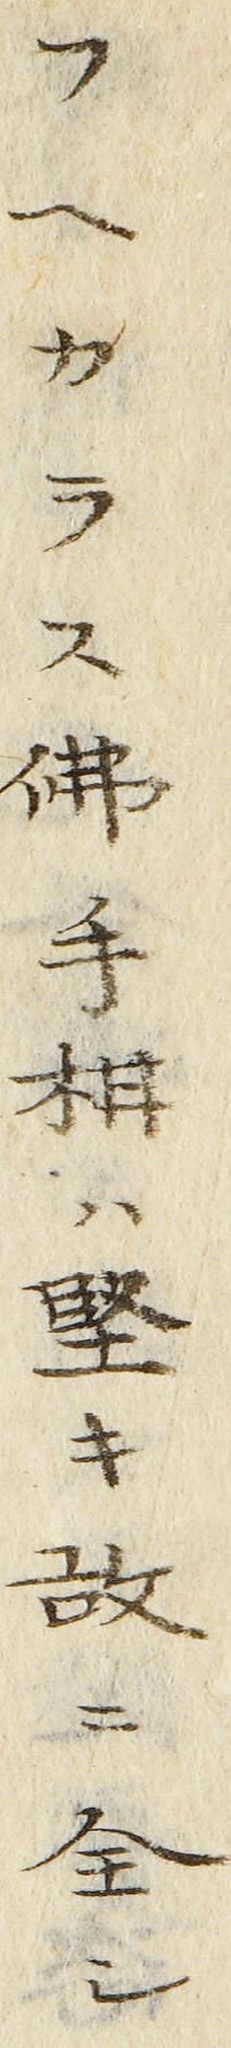フヘカラス仏手柑ハ堅キ故ニ全シ
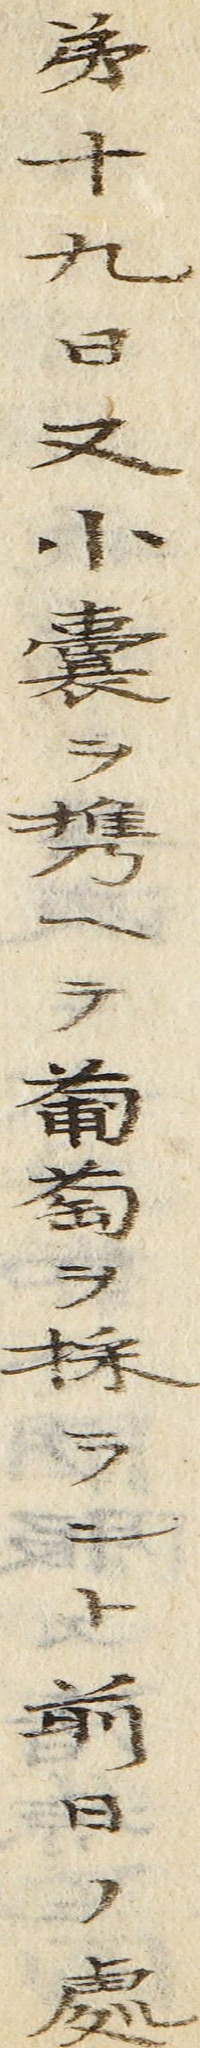第十九日又小嚢ヲ携ヘテ葡萄ヲ採ラント前日ノ処
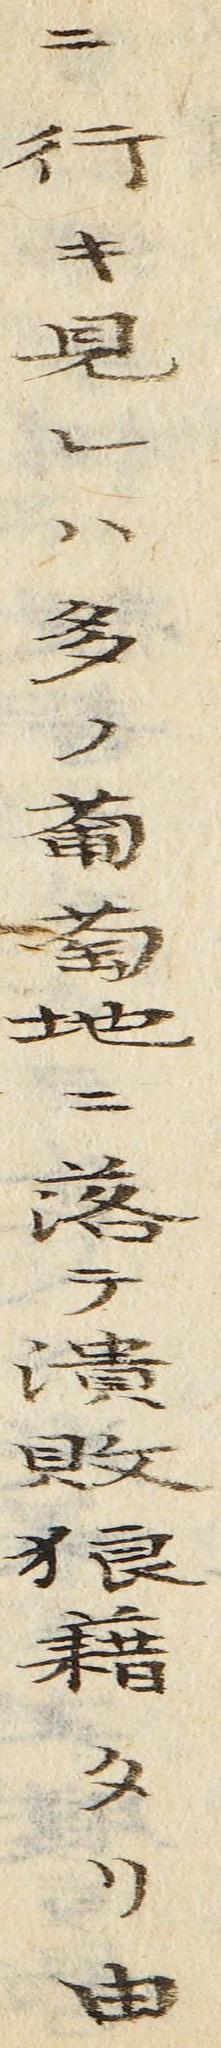ニ行キ見レハ多ノ葡萄地ニ落テ潰敗狼藉タリ由
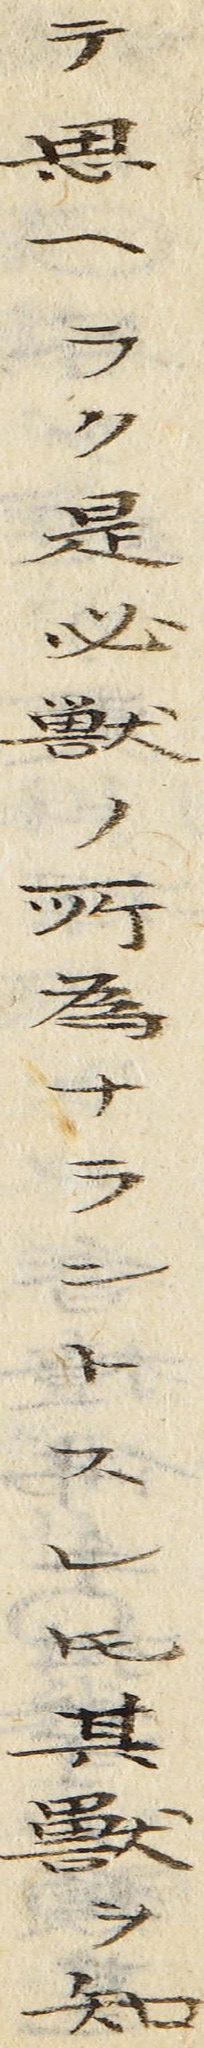テ思ヘラク是必獣ノ所為ナラントスレトモ其獣ヲ知
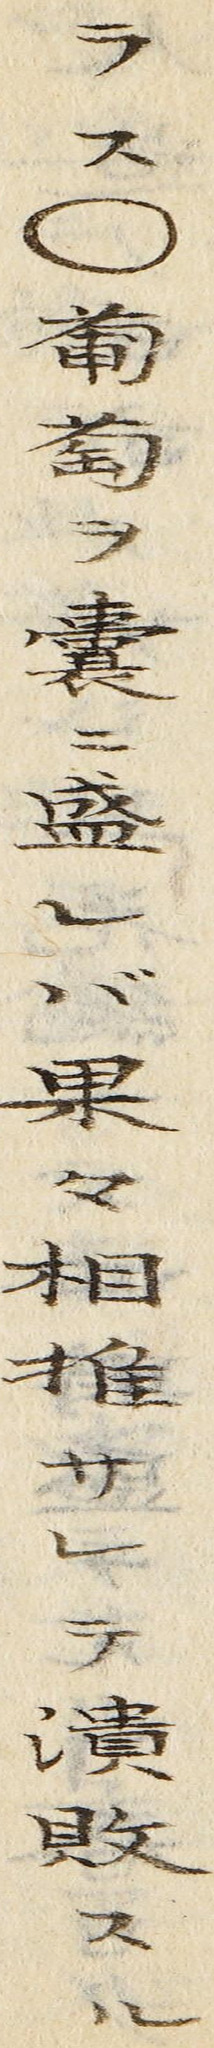ラス◯葡萄ヲ嚢ニ盛レバ果々相推サレテ潰敗スル
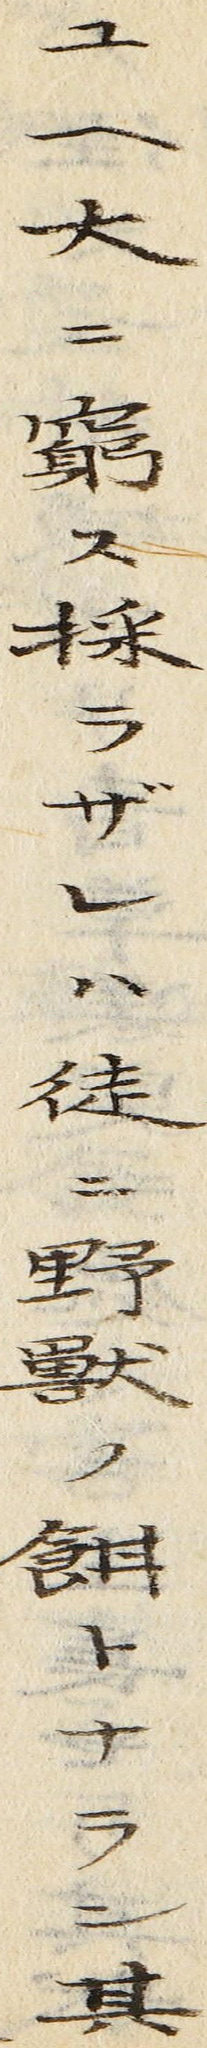ユヘ大ニ窮ス採ラザレハ徒ニ野獣ノ餌トナラン其
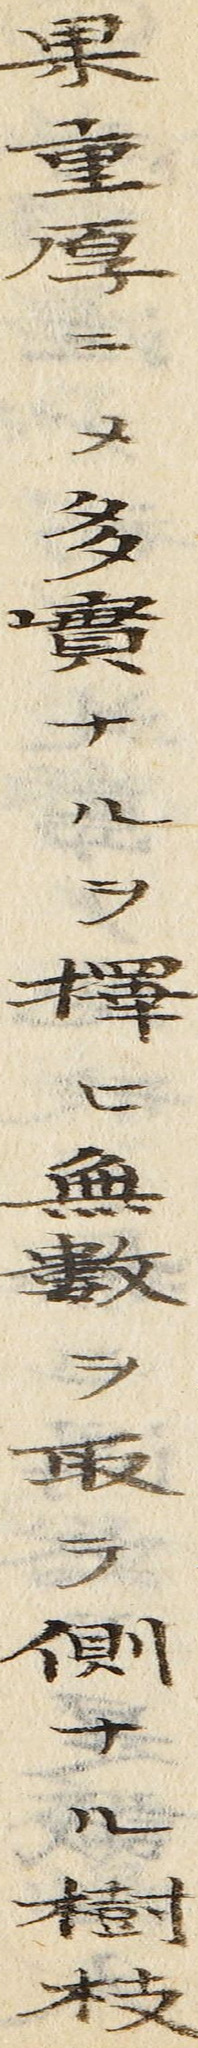果重厚ニシテ多実ナルヲ択ヒ無数ヲ取テ側ナル樹枝
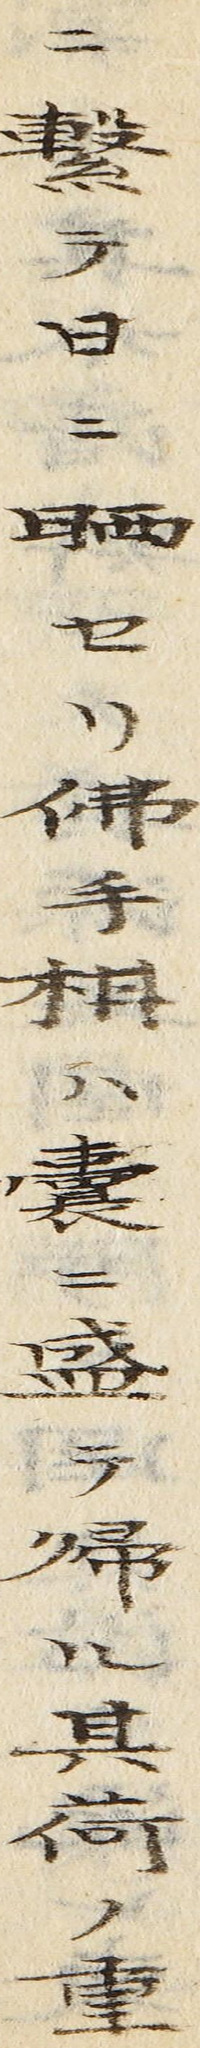ニ繋テ日ニ晒セリ仏手柑ハ嚢ニ盛テ帰ル其荷ノ重
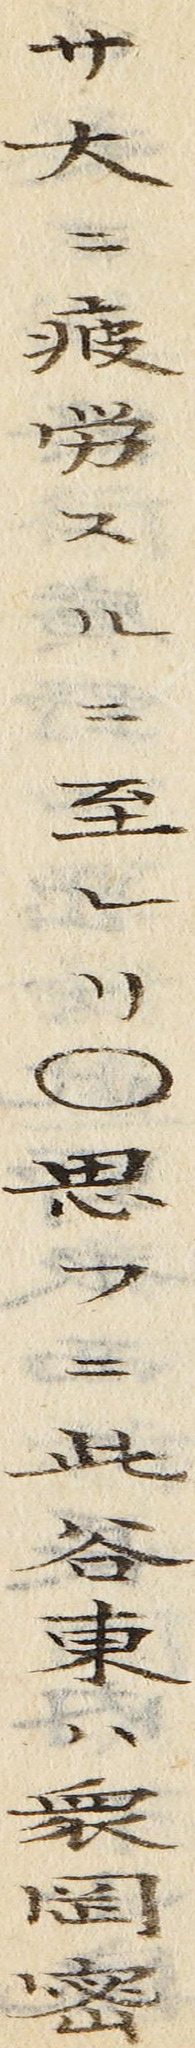サ大ニ疲労スルニ至レリ◯思フニ此谷東ハ衆岡密
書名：漂流紀事
